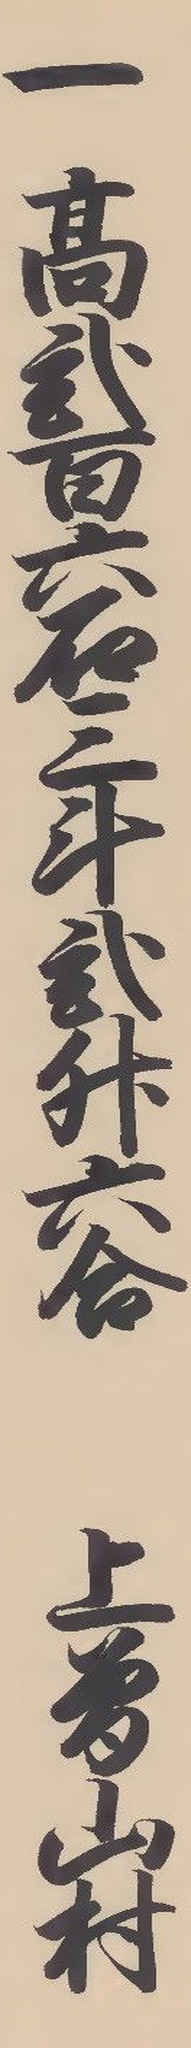一高弐百六石三斗弐升六合上曽山村
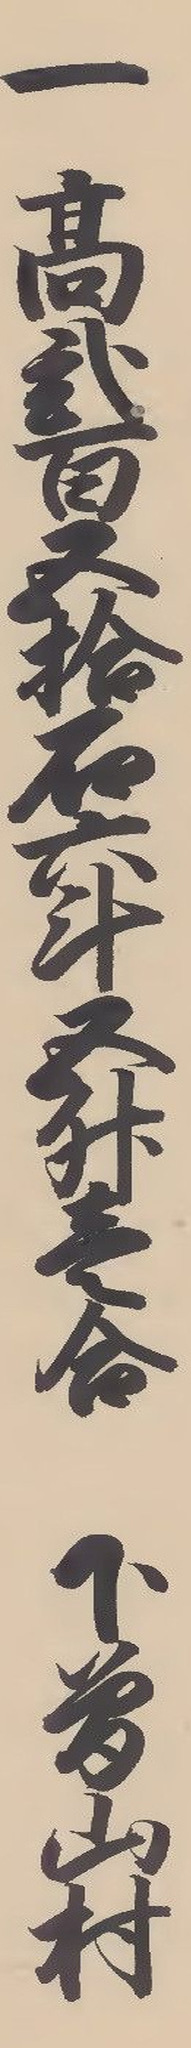一高弐百五拾石六斗五升壱合下曽山村
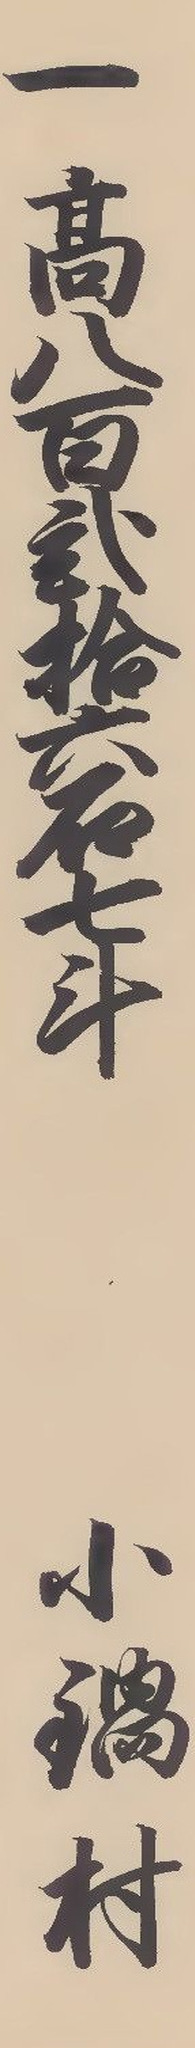一高八百弐拾六石七斗小鍋村
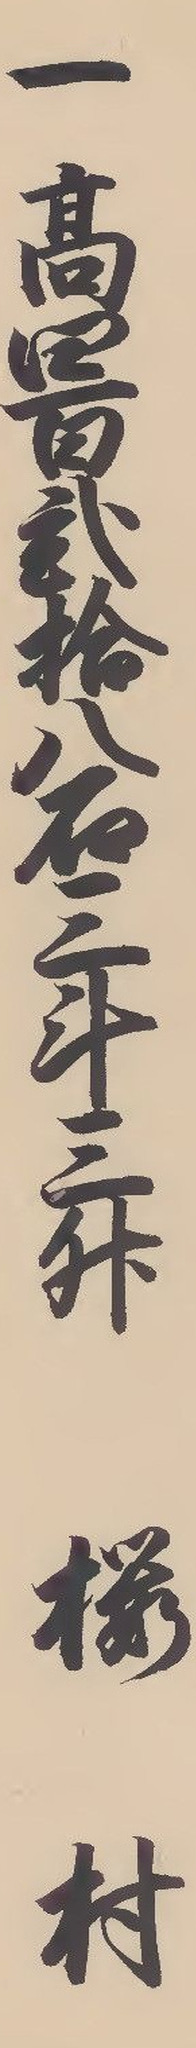一高四百弐拾八石三斗三升桜村

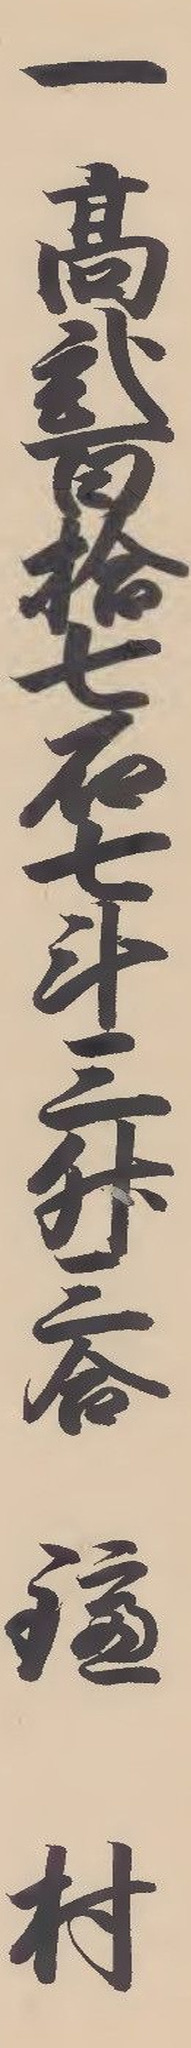一高弐百拾七石七斗三升三合鑪村
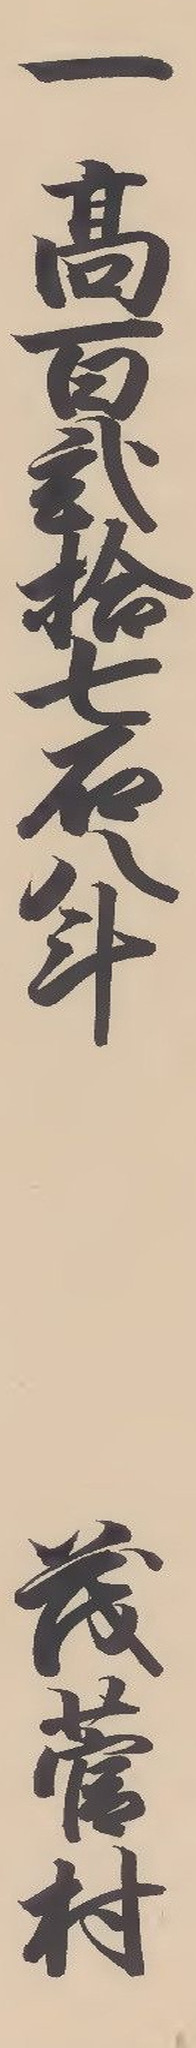一高百弐拾七石八斗茂菅村
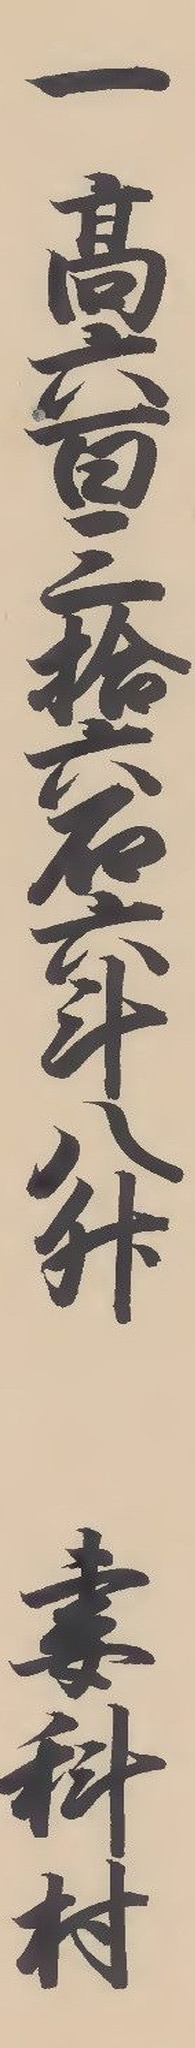一高六百三拾六石六斗八升妻科村
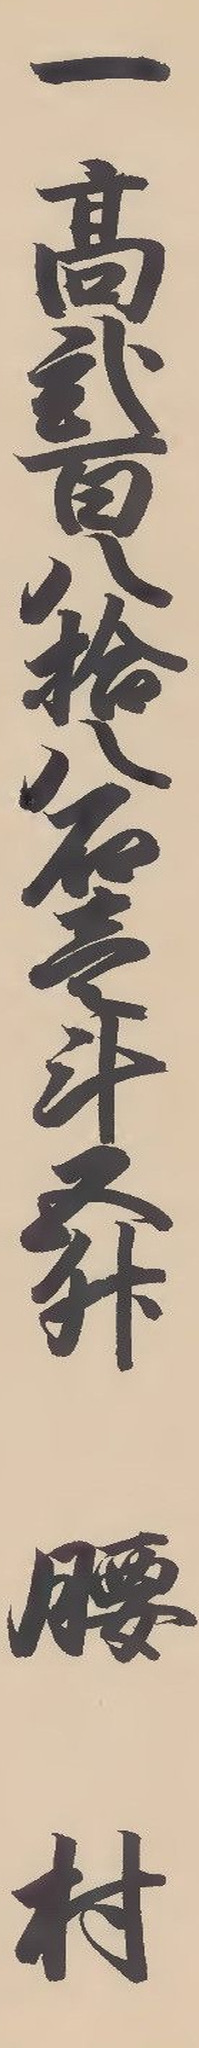一高弐百八拾八石壱斗五升腰村
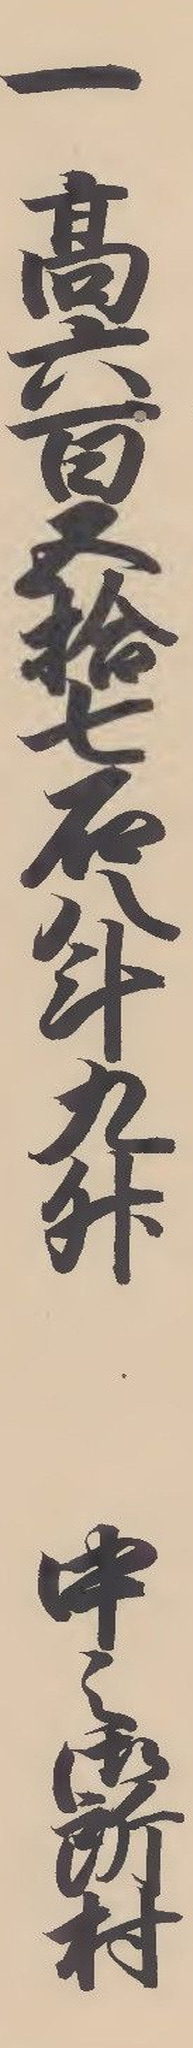一高六百五拾七石八斗九升中之御所村
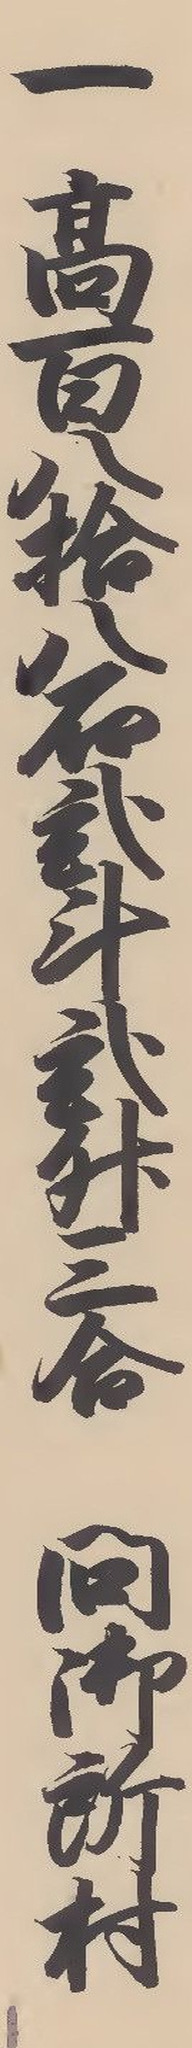一高百八拾八石弐斗弐升三合問御所村
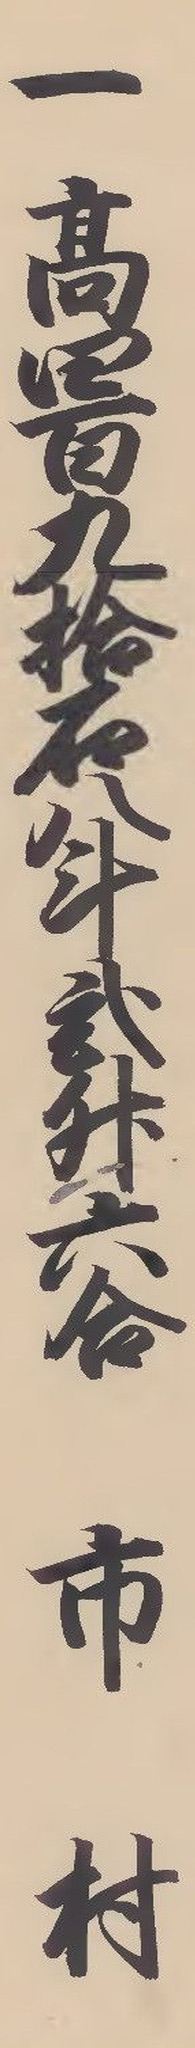一高四百九拾石八斗弐升六合市村

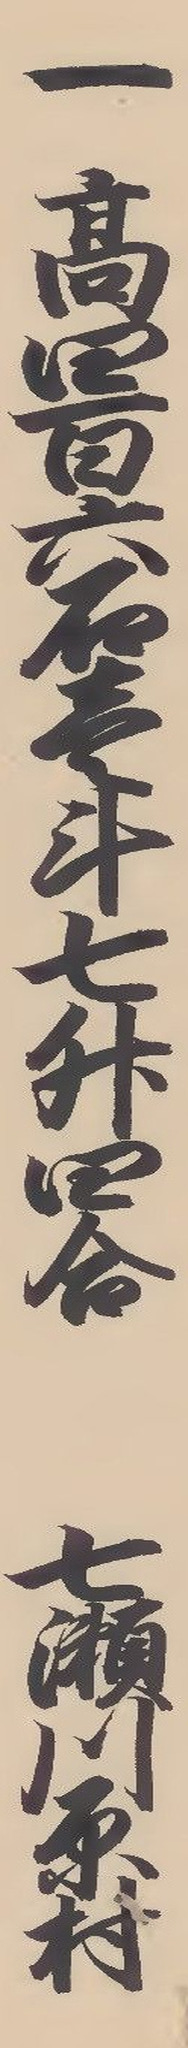一高四百六石壱斗七升四合七瀬川原村
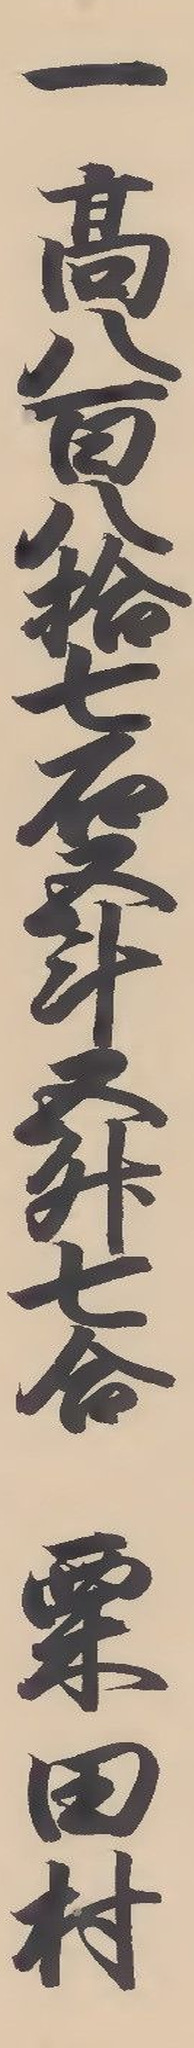一高八百八拾七石五斗五升七合栗田村
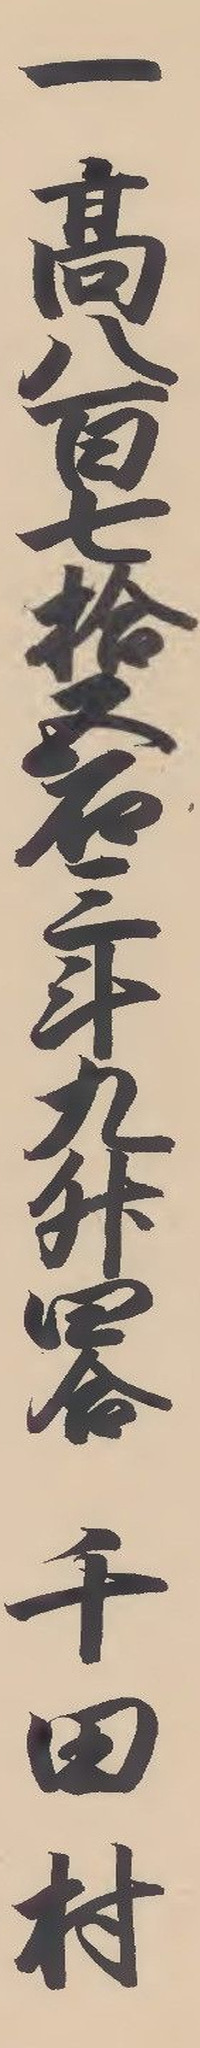一高八百七拾五石三斗九升四千田村
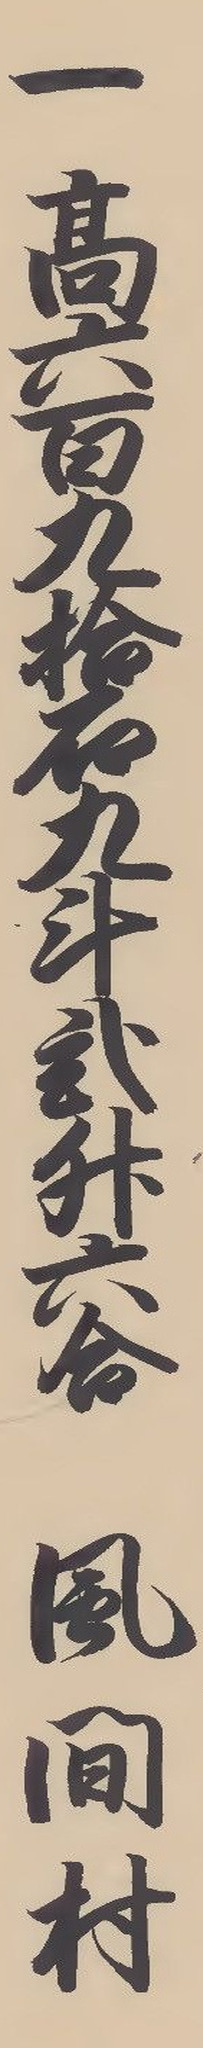一高六百九拾石九斗弐升六合風間村
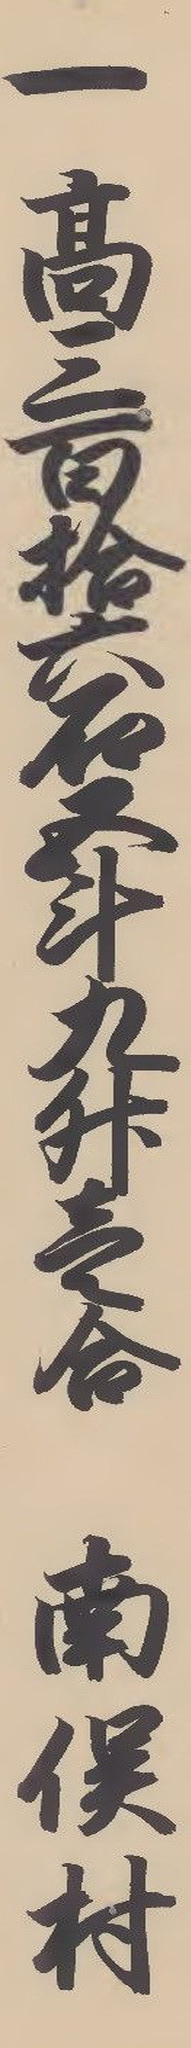一高三百拾六石五斗九升壱合南俣村
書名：信濃国郷帳
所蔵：国立公文書館 National Archives of Japan
